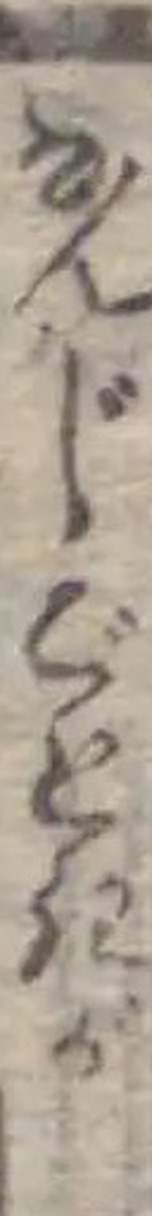なんじごときが
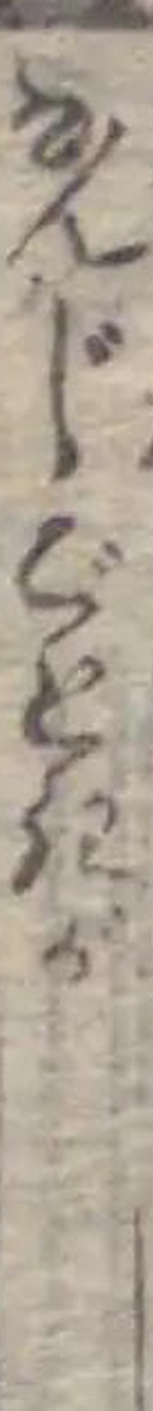なんじごときが
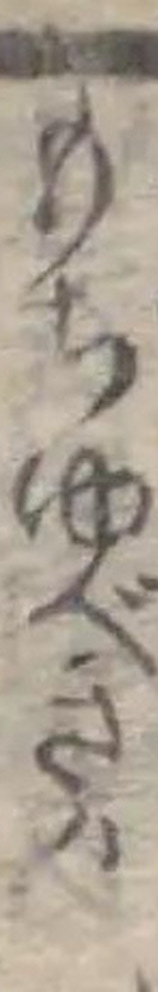もちゆべきか
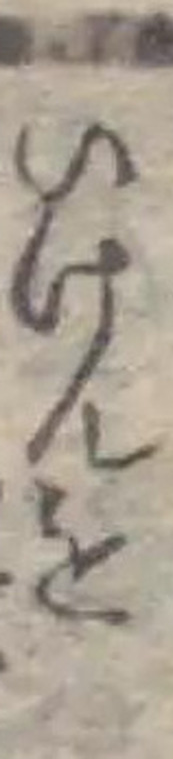いけんを
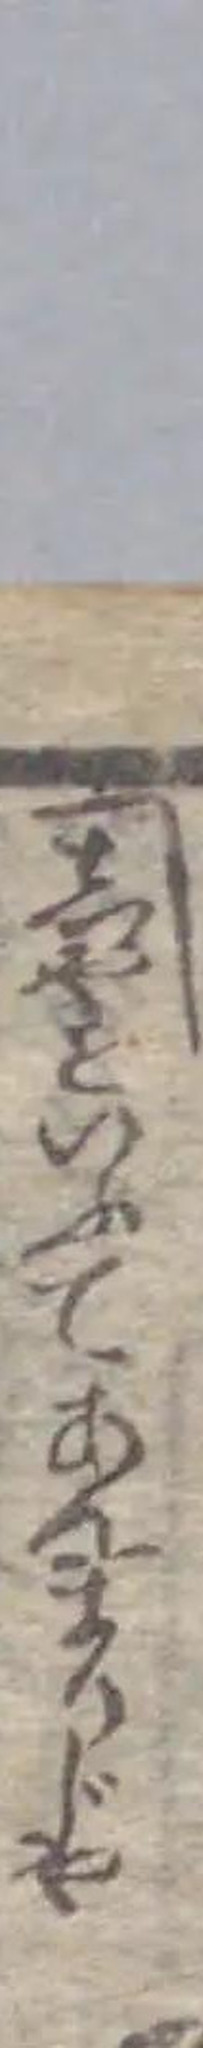〽しやといふてあんまりじや
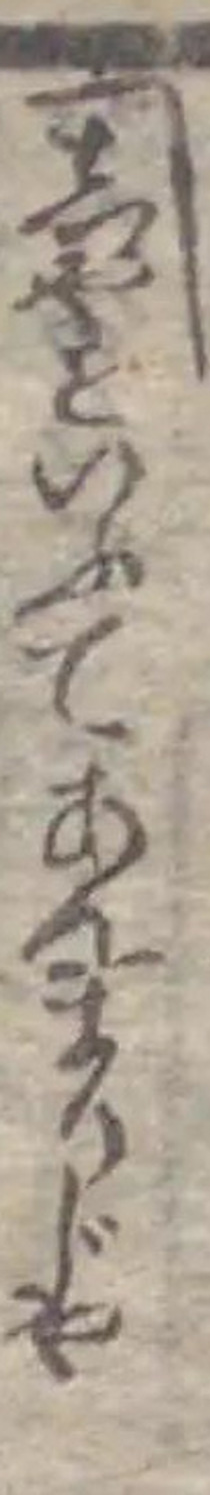〽しやといふてあんまりじや
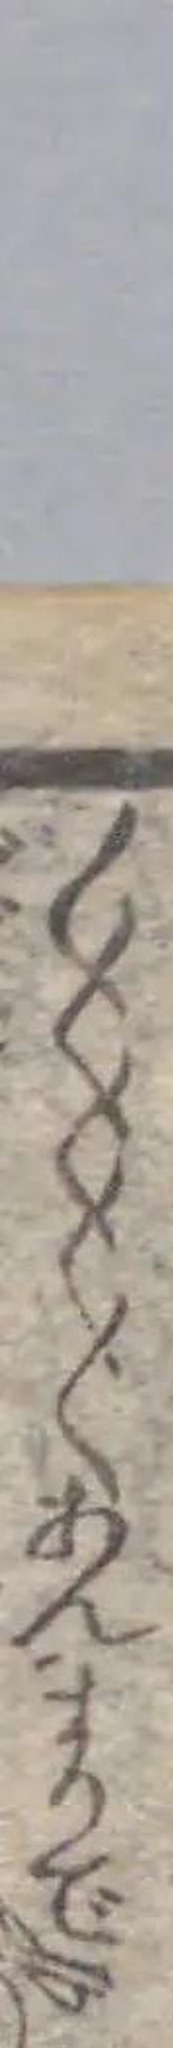〳〵〳〵〳〵〳〵〳〵あんまりで
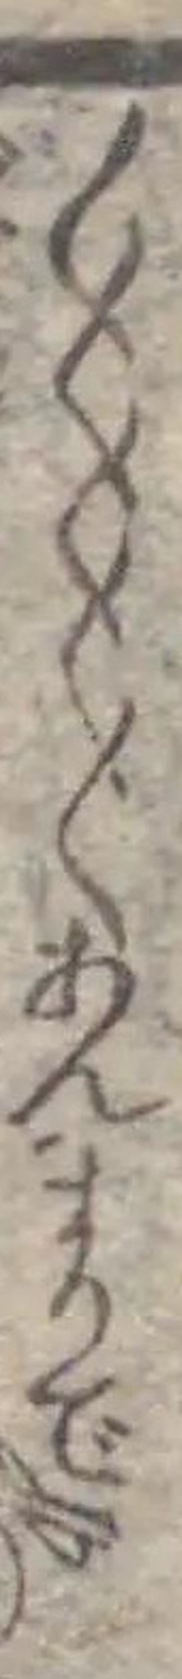〳〵〳〵〳〵〳〵〳〵あんまりで
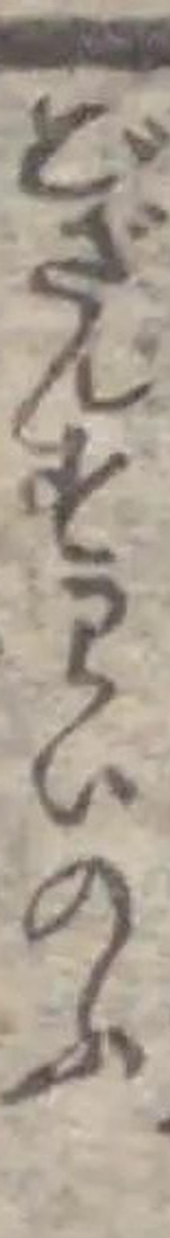ござんすわいのふ
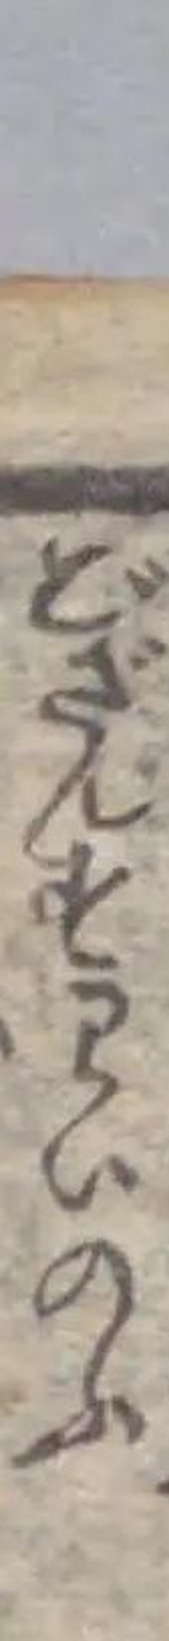ござんすわいのふ
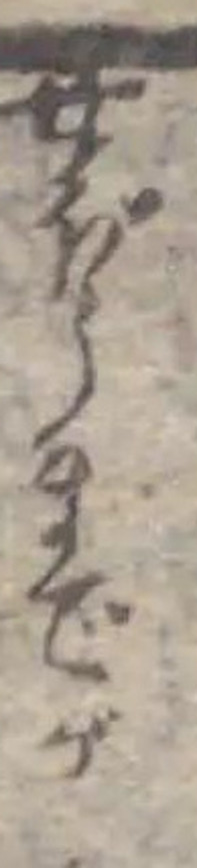女ぼうまでが
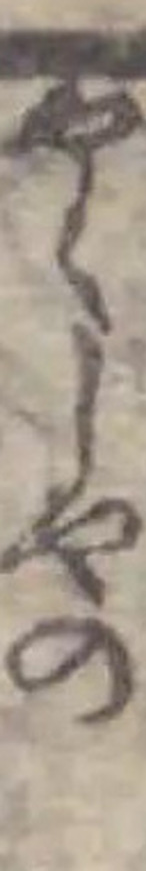やくしやの
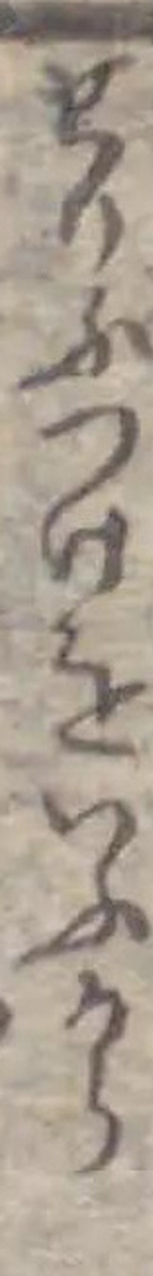せりふつけをいふから

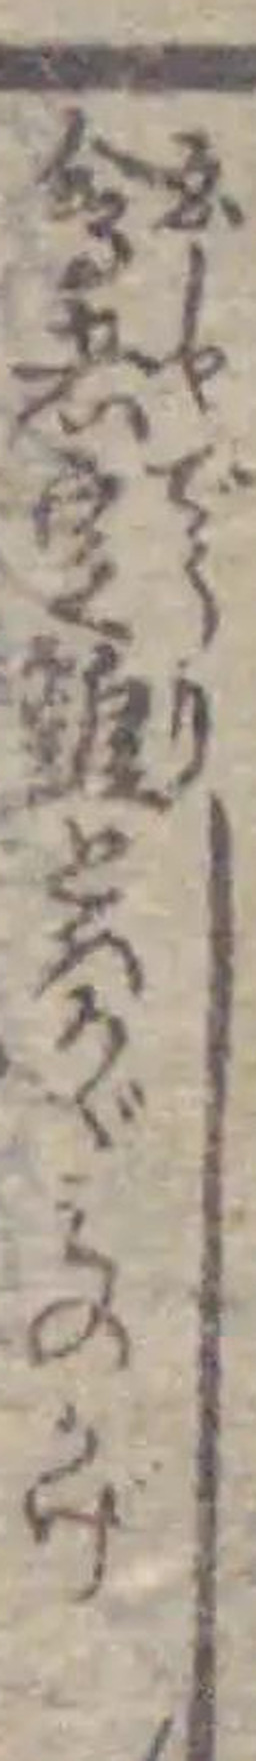会者定離とはかゞみのかけ
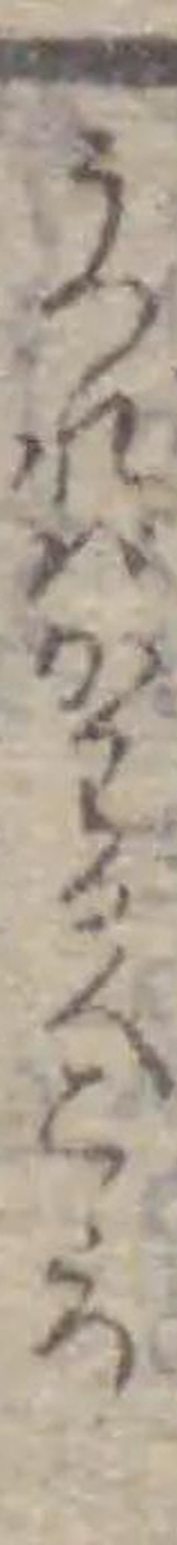うつればかわる人こゝろ
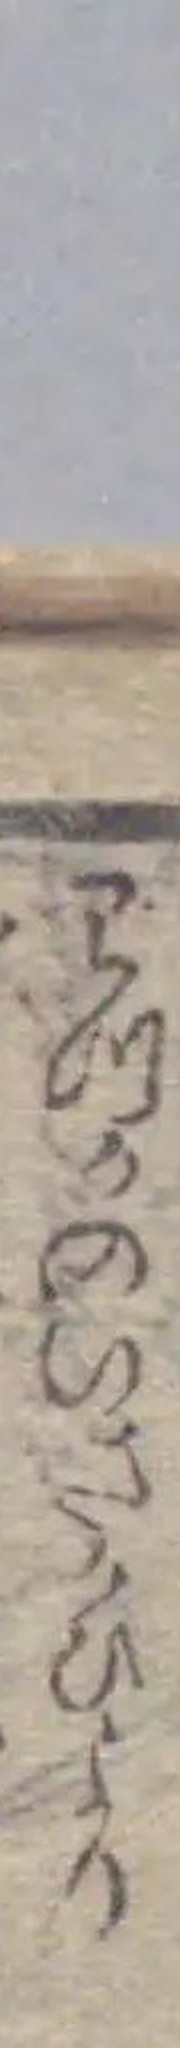わつかのいさかひより
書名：福壽海旡量品玉 3巻
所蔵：国立国会図書館 National Diet Library, JAPAN
